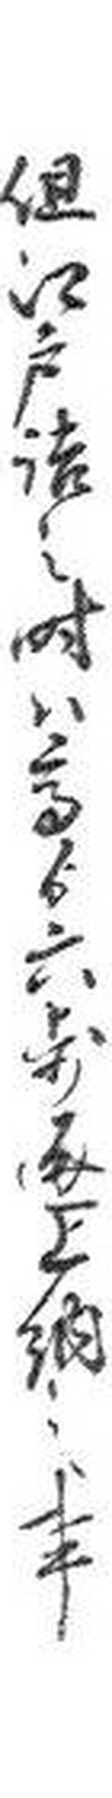但江戸詰之時ハ高ゟ七歩通上納之事
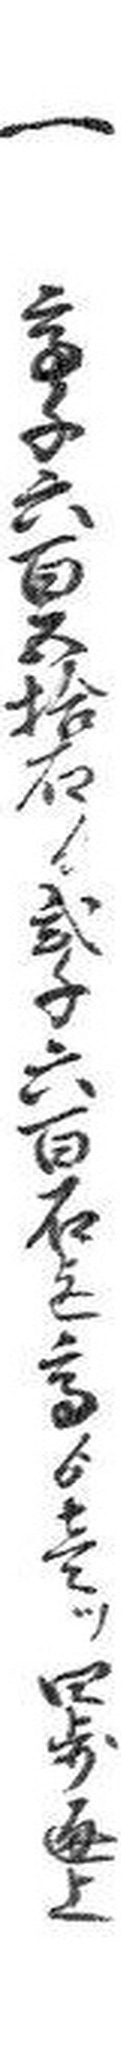一高千六百五拾石ゟ弐千六百石迄高ゟ壱ツ四歩通上
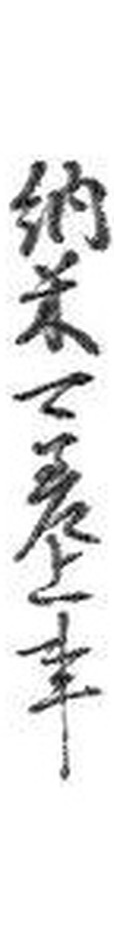納米可差上事
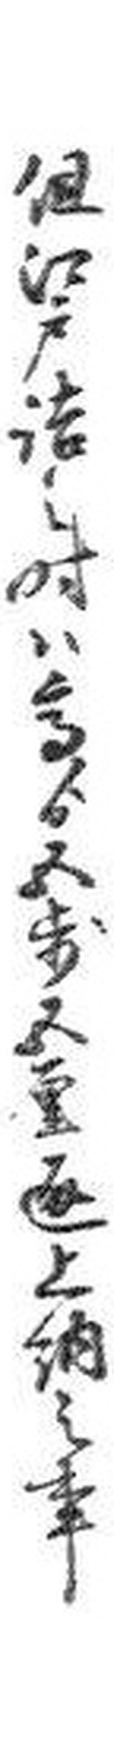但江戸詰之時ハ高ゟ五歩五厘通上納之事
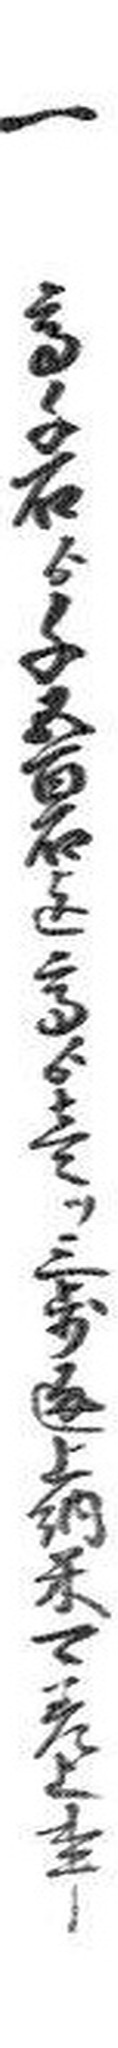一高千石ゟ千五百石迄高ゟ壱ツ三歩通上納米可差上事
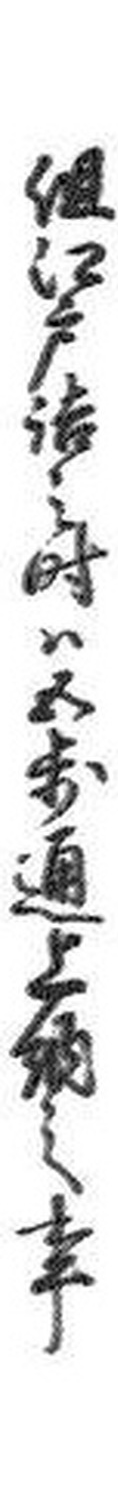但江戸詰之時ハ五歩通上納之事
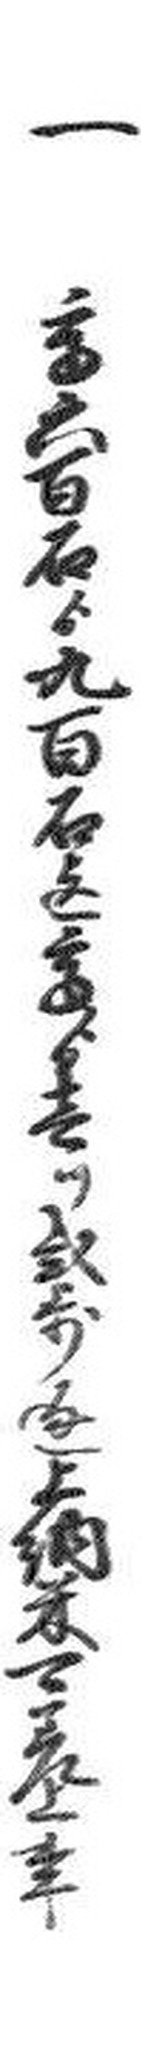一高六百石ゟ九百石迄高ゟ壱ツ弐歩通上納米可差上事
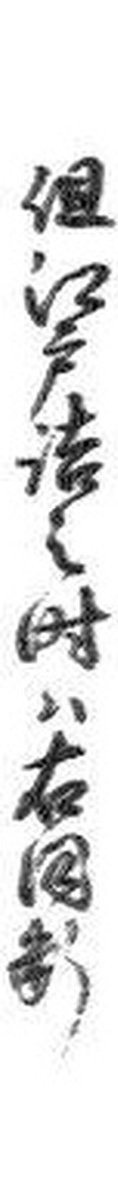但江戸詰之時ハ右同断
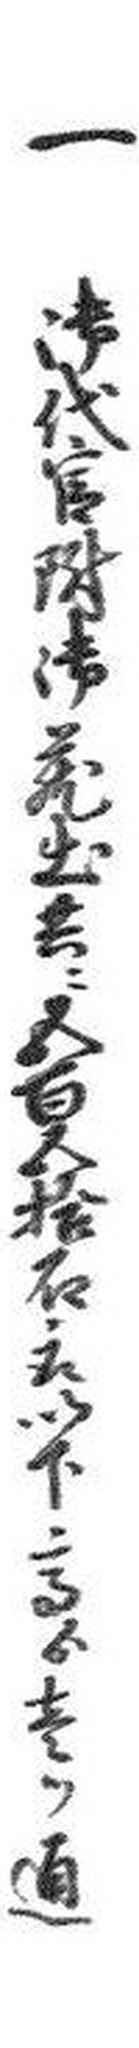一御代官付御蔵出共ニ五百五拾石取以下高ゟ壱ツ通
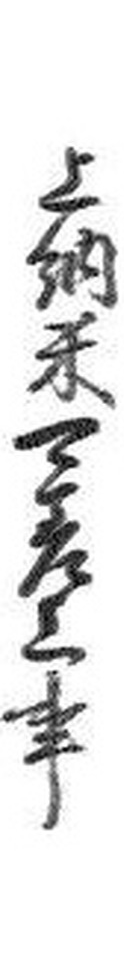上納米可差上事
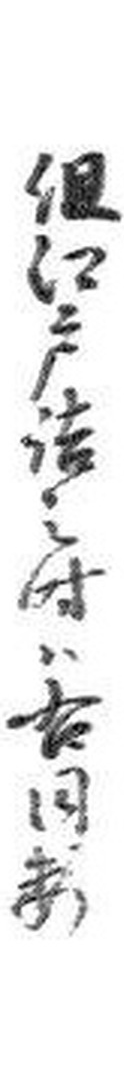但江戸詰之時ハ右同断
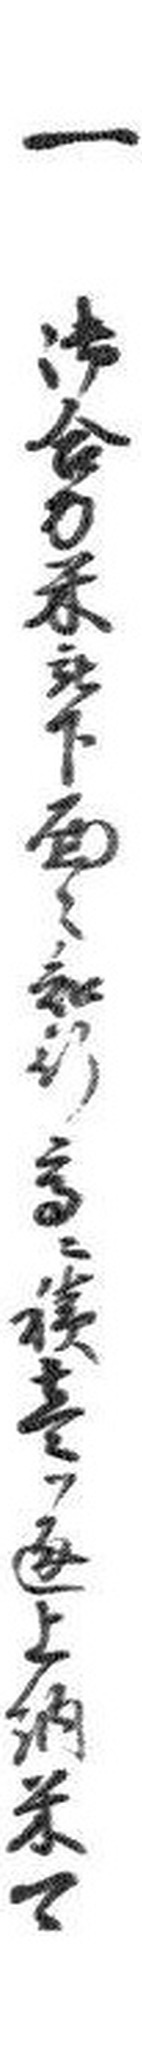一御合力米被下面々知行高ニ積壱ツ通上納米可
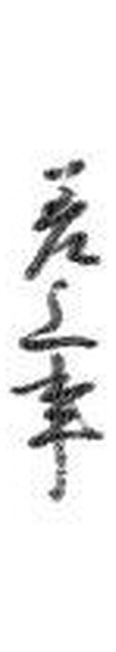差上事
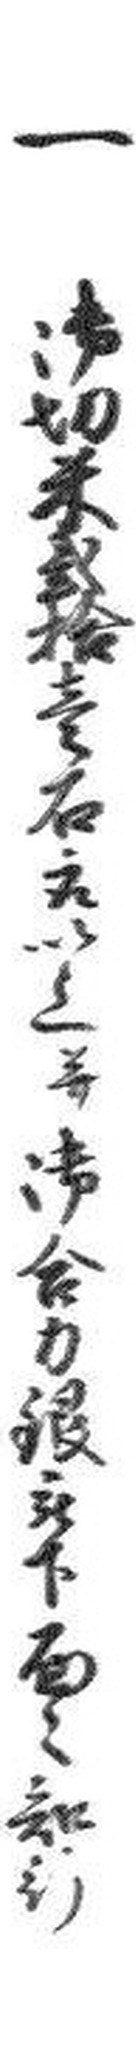一御切米弐拾壱石取以上并御合力銀被下面々知行

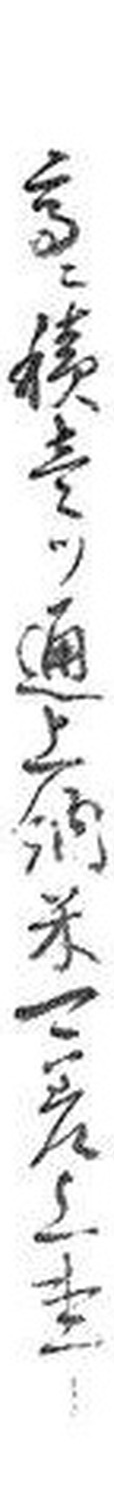高ニ積壱ツ通上納米可差上事
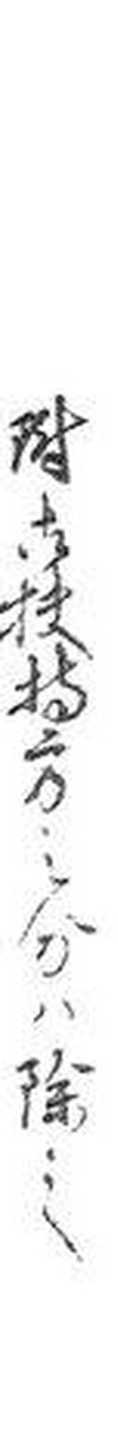附御扶持方之分ハ除之
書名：家譜 二十三 吉品公 従宝永元年到同二年
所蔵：福井県文書館 Fukui Prefectural Archives
